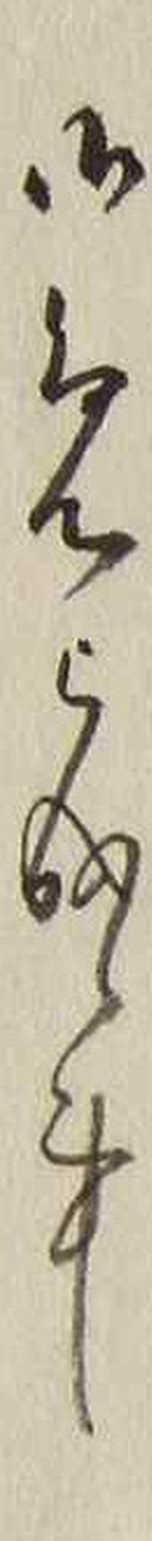御免被成候事

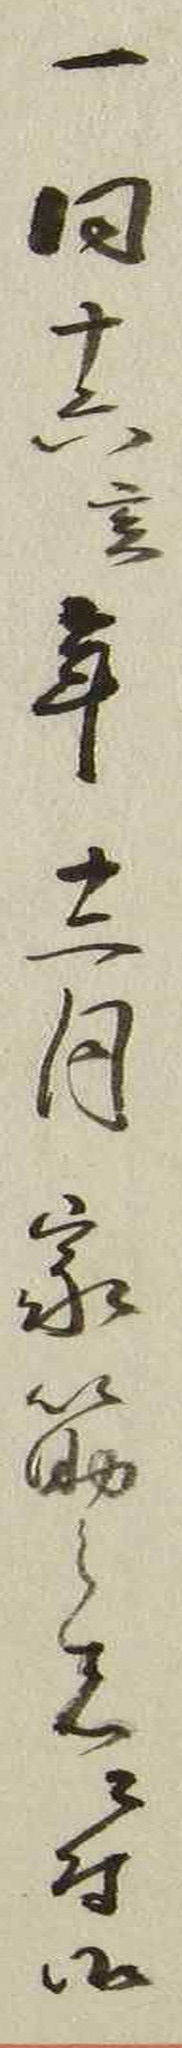一同十六亥年十二月家筋之者に付御
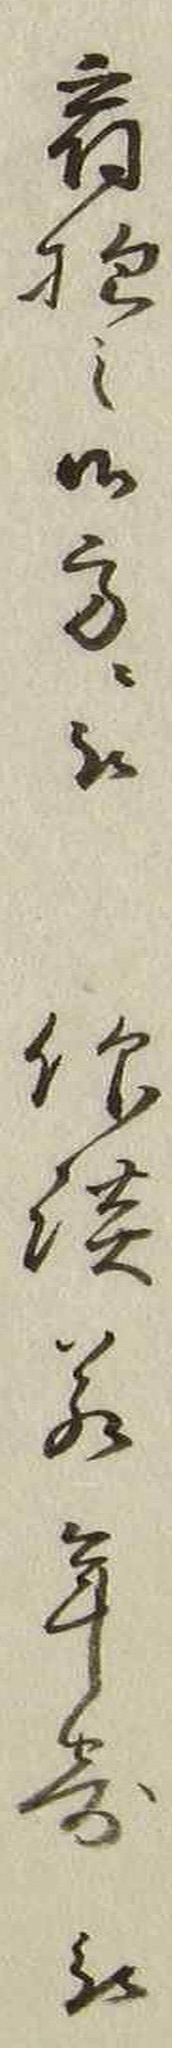育抱之御方に被仰談若年寄被
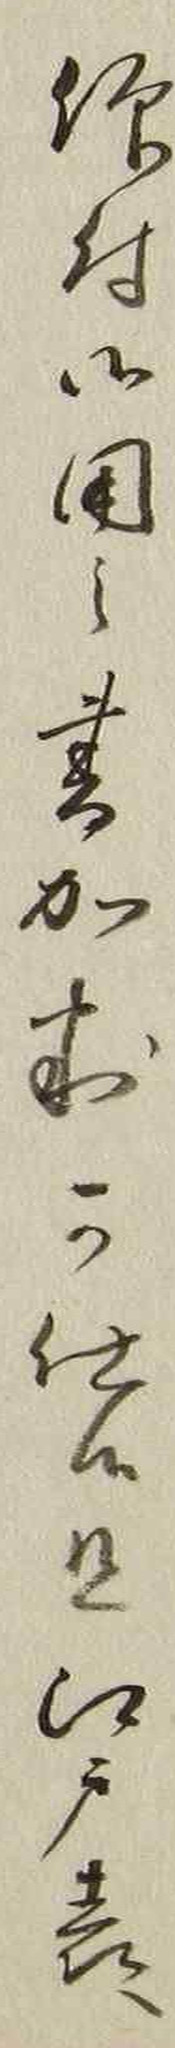仰付御用之書判可仕候旦江戸表へ
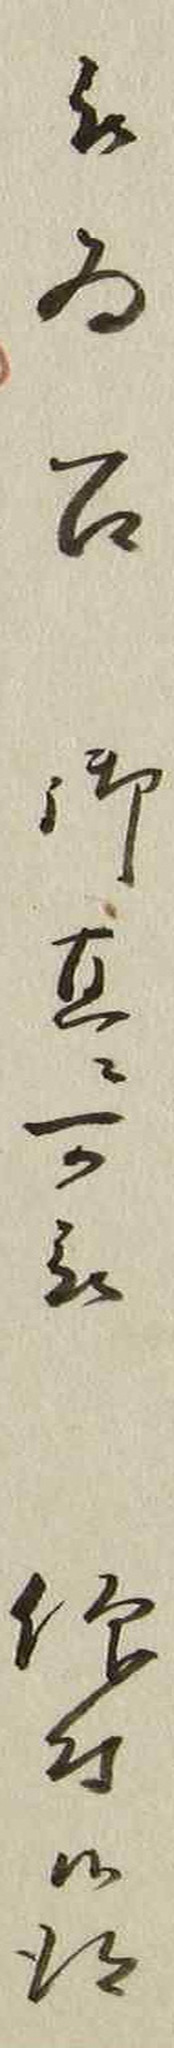被為召御直に可被仰付侯得
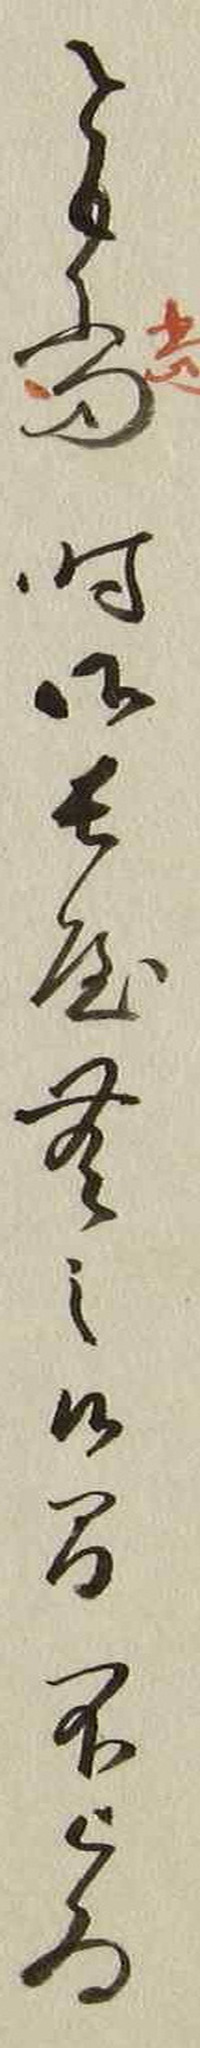とも当時御長屋無之候間不被為
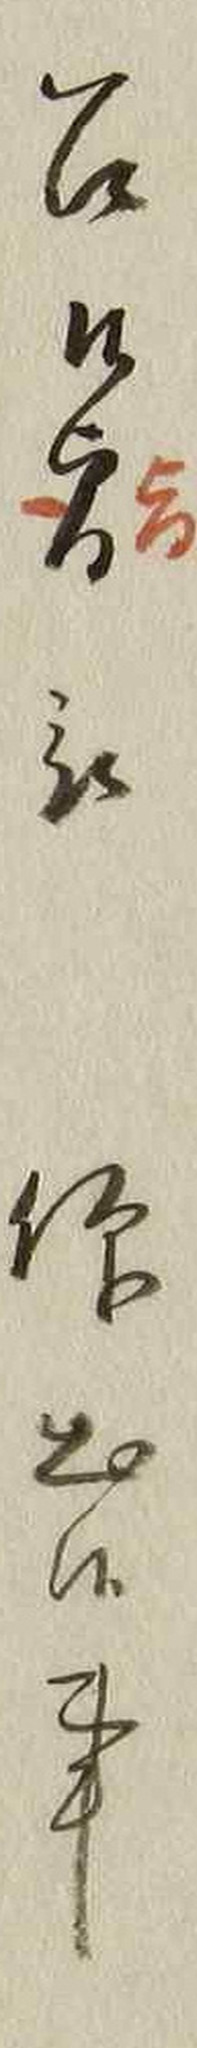召候旨被仰出候事
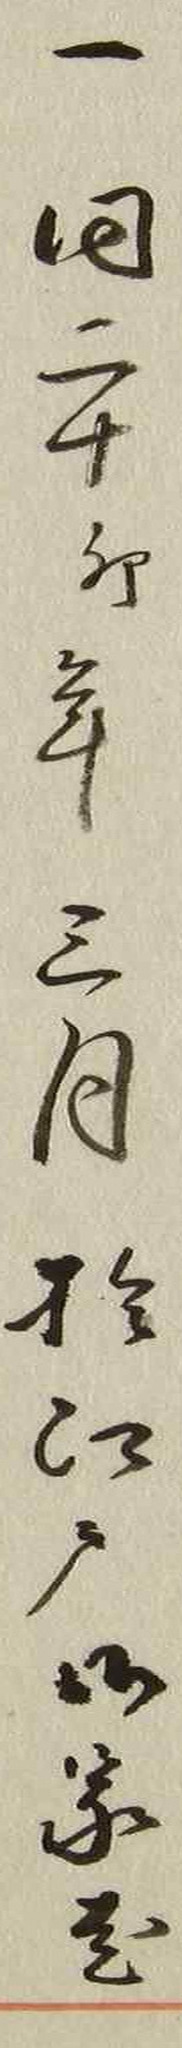一同二十卯年三月於江戸御家老
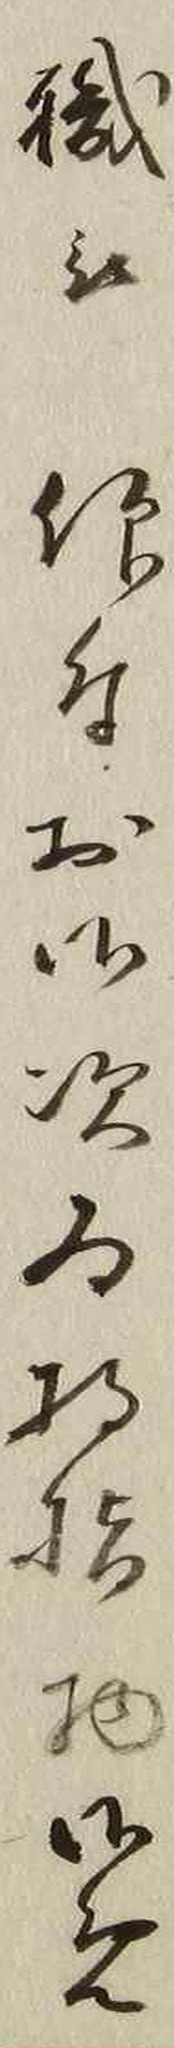職被仰付於御次為持指物御免
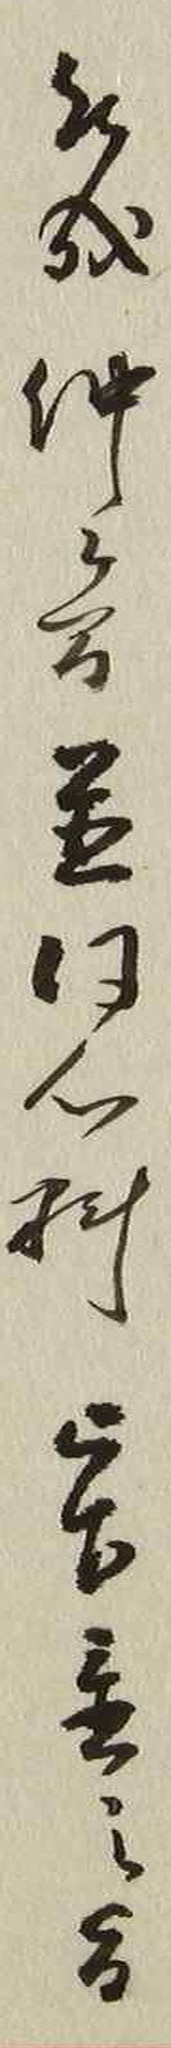被成仲ヶ間並同心料被下置之旨
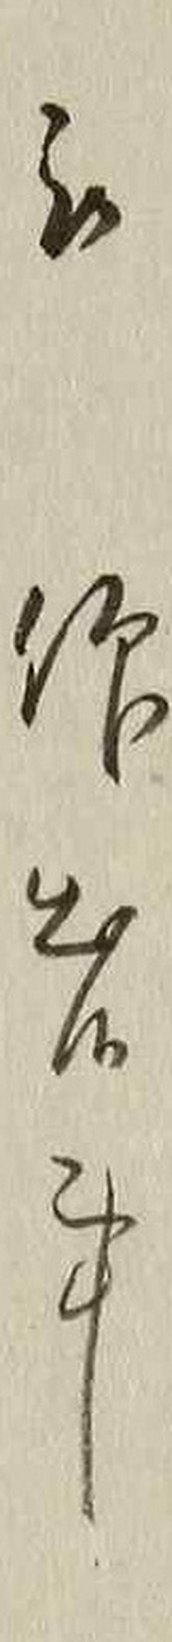被仰出候事
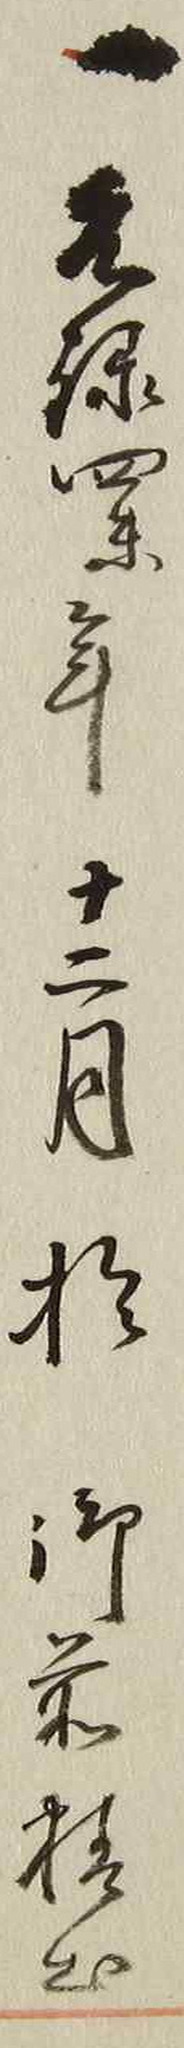一元禄四未年十二月於御前精出
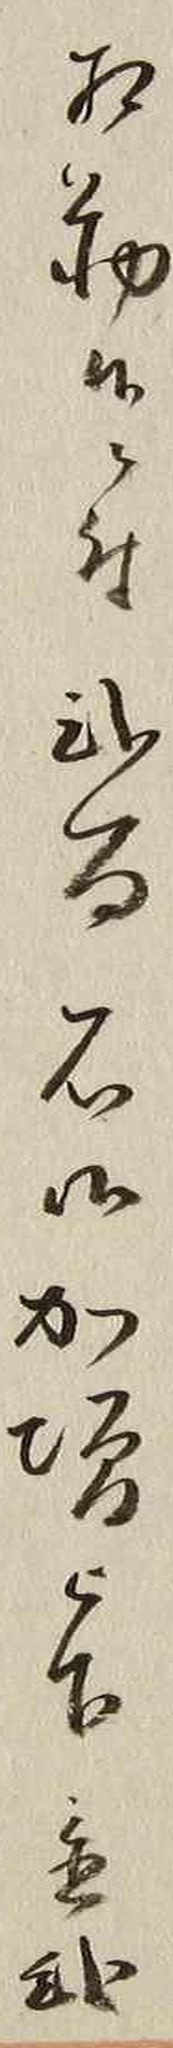相勤候に付弐百石御加増被下置弐
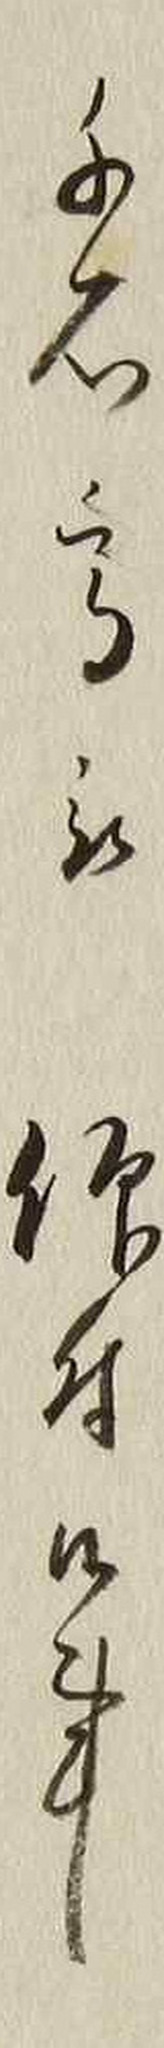千石高被仰付候事
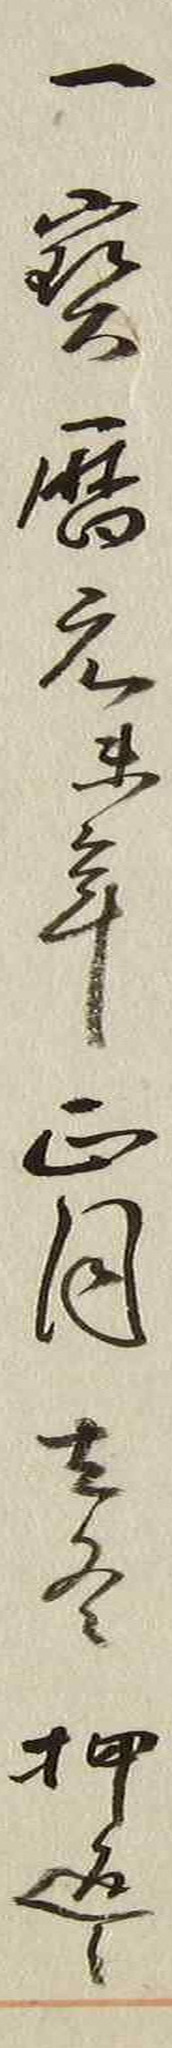一宝暦元未年正月去冬押返し
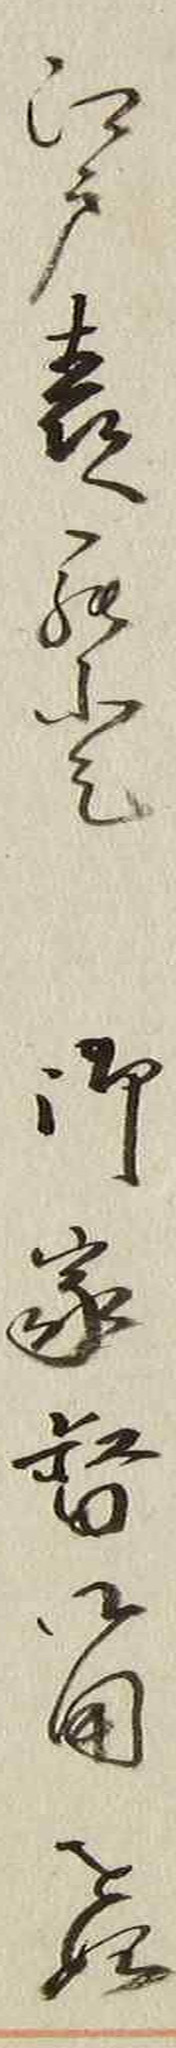江戸表へ罷登御家督御用を始
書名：諸士系譜　巻之159　な之部1
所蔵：会津若松市立会津図書館
